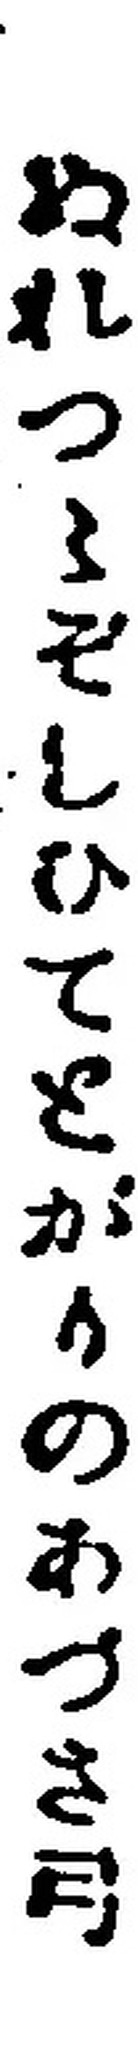ぬれつゝぞしひてとがりのあづさ弓
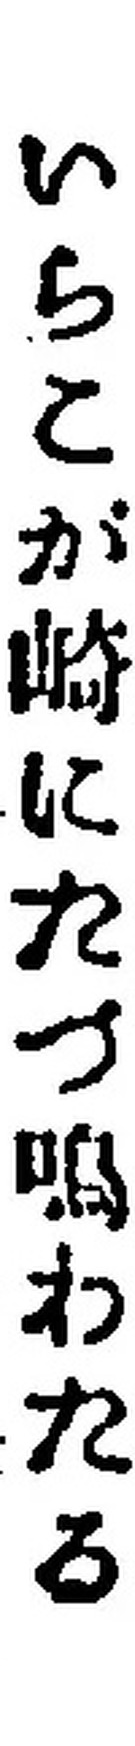いらこが崎にたづ鳴わたる
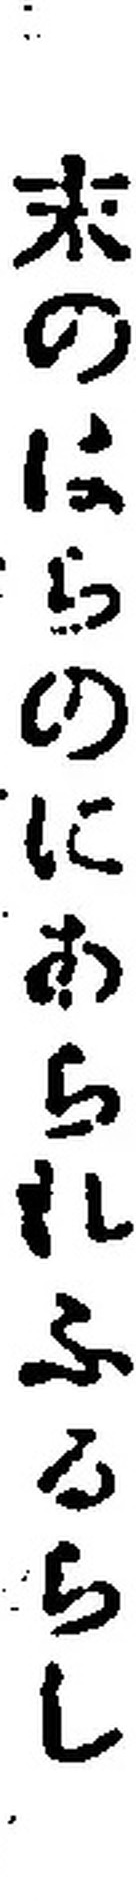末のはらのにあられふるらし
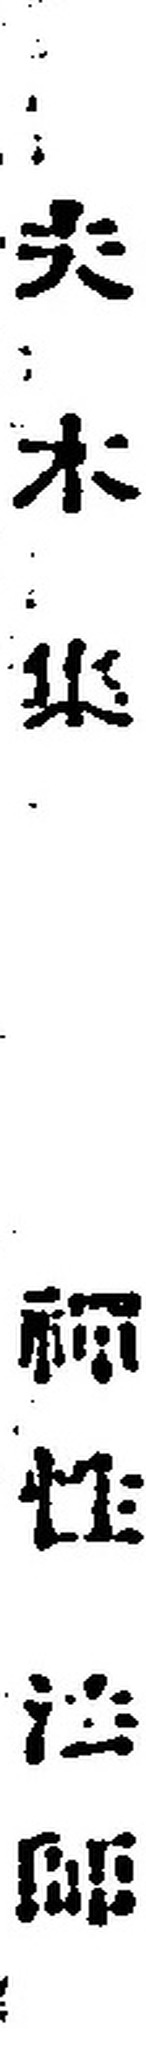夫木集禅性法師
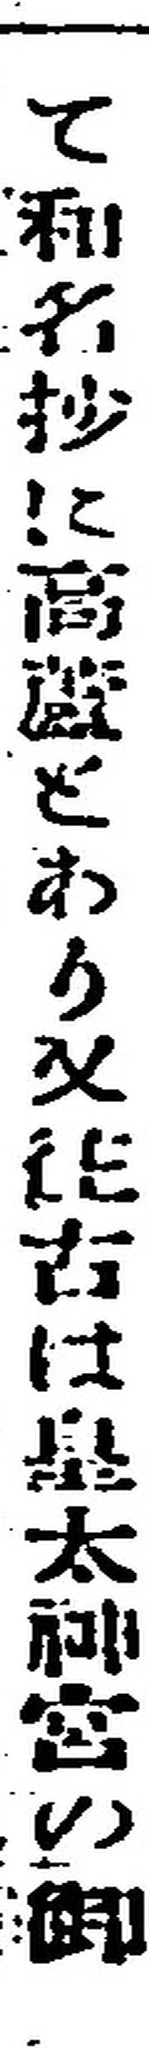て和名抄に高蘆とあり又往古は皇太神宮の御
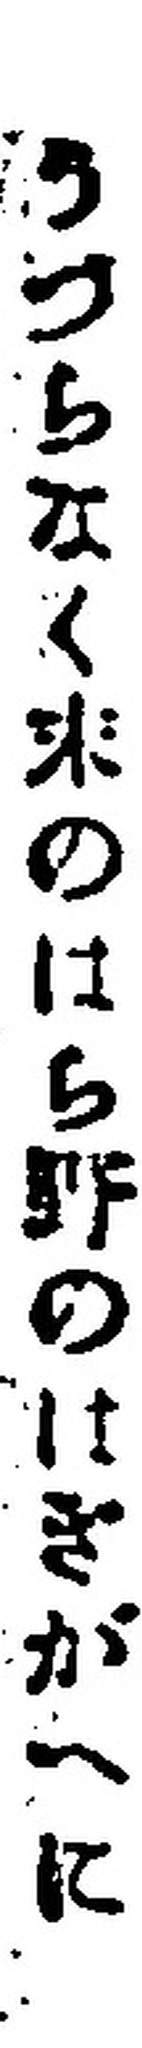うづらなく末のはら野のはぎがへに
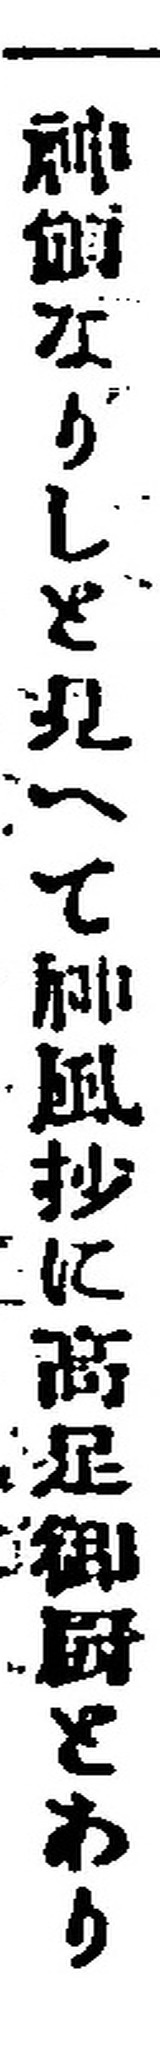神領なりしと見へて神風抄に高足御厨とあり

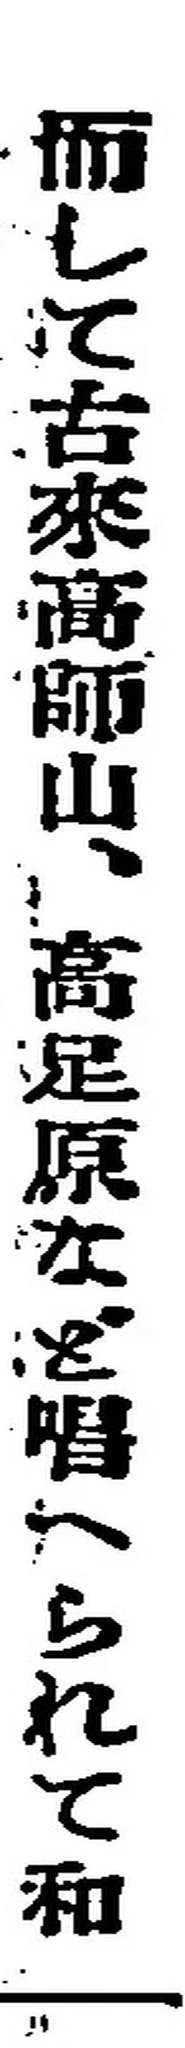而して古来高師山、高足原など唱へられて和
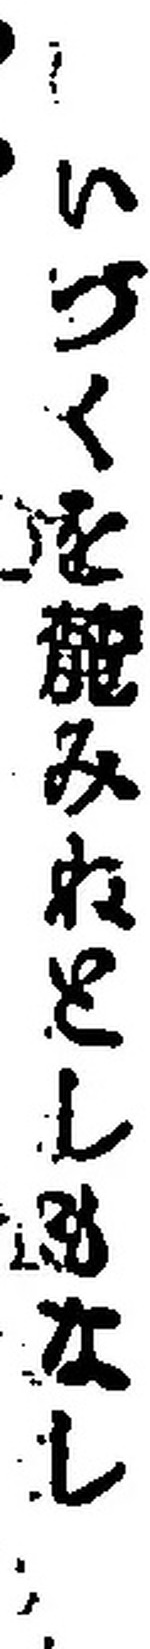いづくを麓みねとしもなし
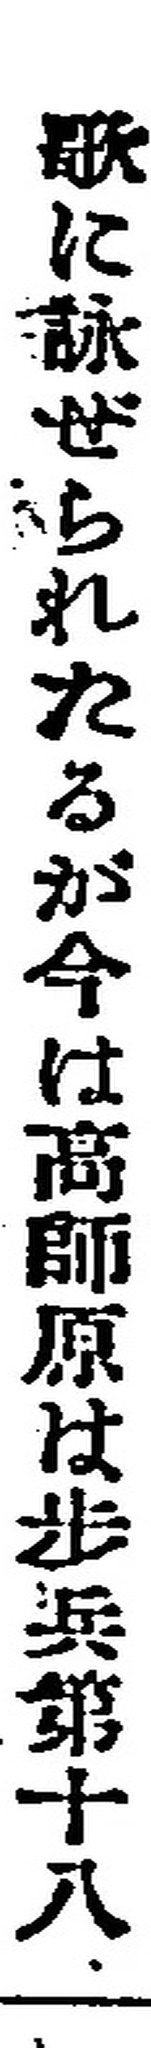歌に詠せられたるが今は高師原は歩兵第十八
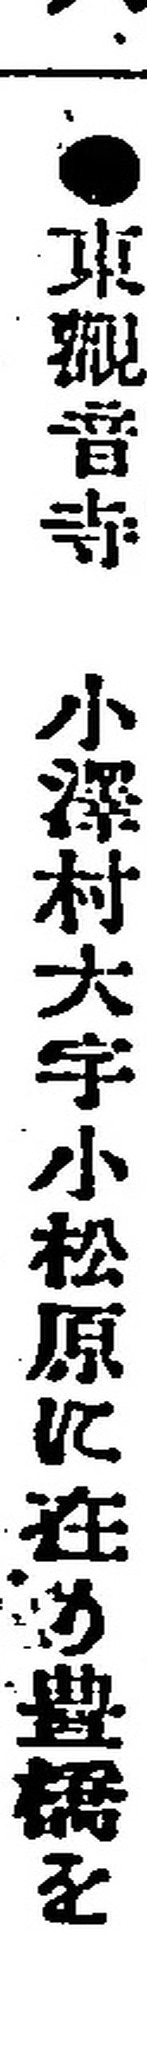●東観音寺小沢村大字小松原に在り豊橋を
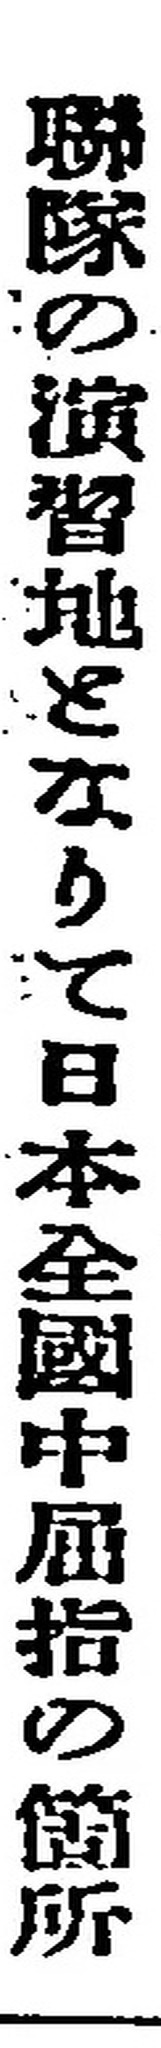聯隊の演習地となりて日本全国中屈指の箇所
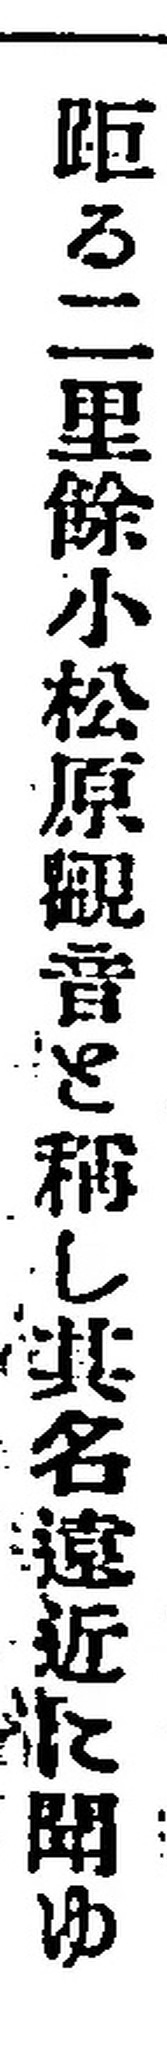距る二里余小松原観音と称し其名遠近に聞ゆ
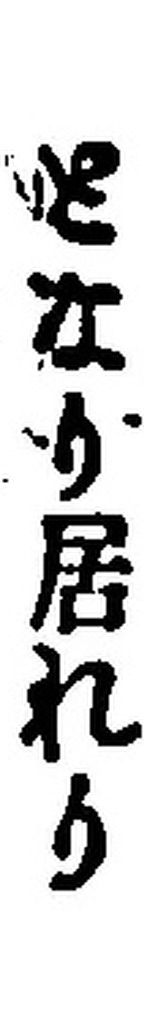となり居れり
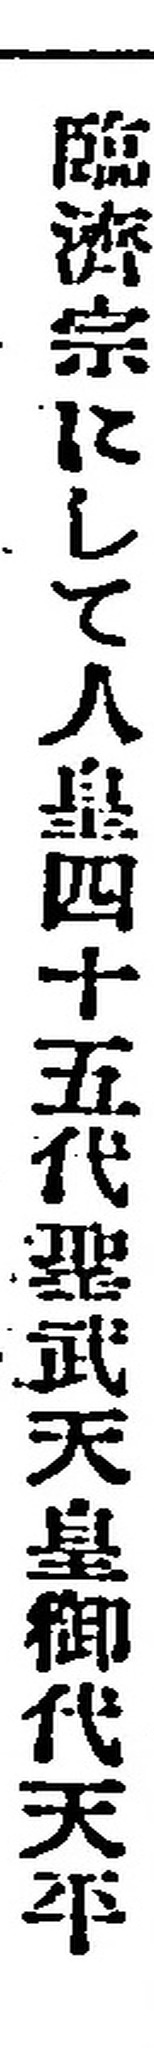臨済宗にして人皇四十五代聖武天皇御代天平
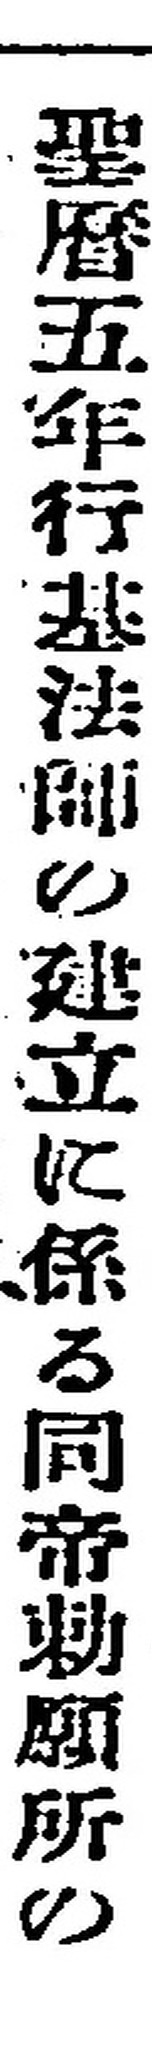聖暦五年行基法師の建立に係る同帝勅願所の
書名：東参名勝案内
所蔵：国立国会図書館 National Diet Library, JAPAN
